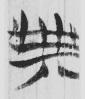典
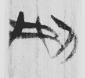刑
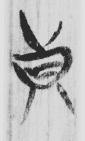真
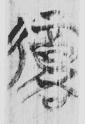復
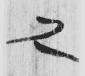氒
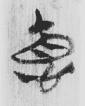惪
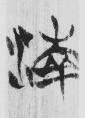湳
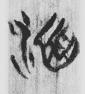湎
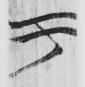于
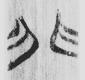非
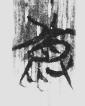彝
